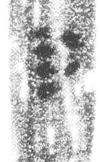是
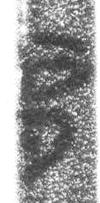胃（謂）
